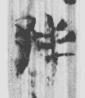邦
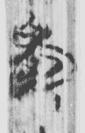{爪家}
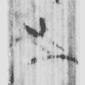之
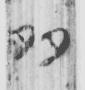多
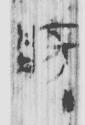{疒方}
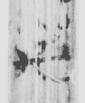萬
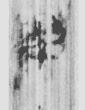民
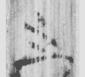之
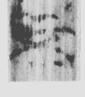不
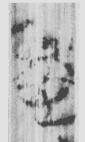恤
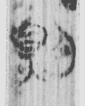則
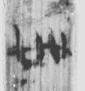{廿廿}
